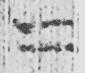二
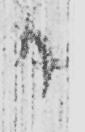千
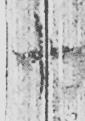七
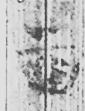百
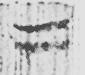二
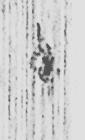千
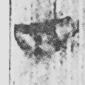四
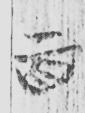百
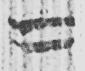二
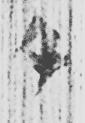千
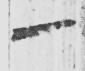一
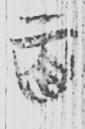百
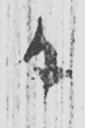千
